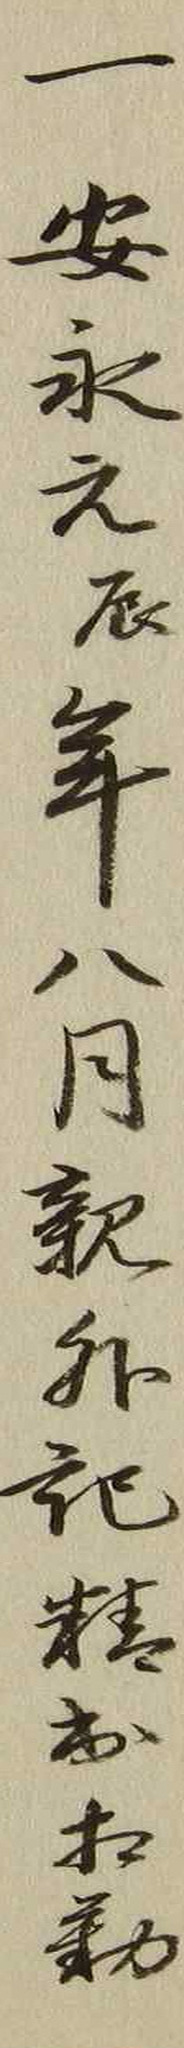一安永元辰年八月親外記精出相勤
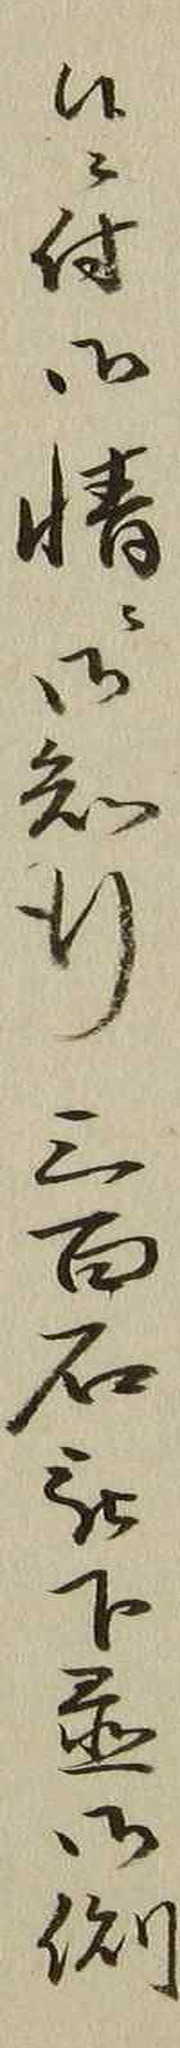候に付御情に御知行三百石被下置御側
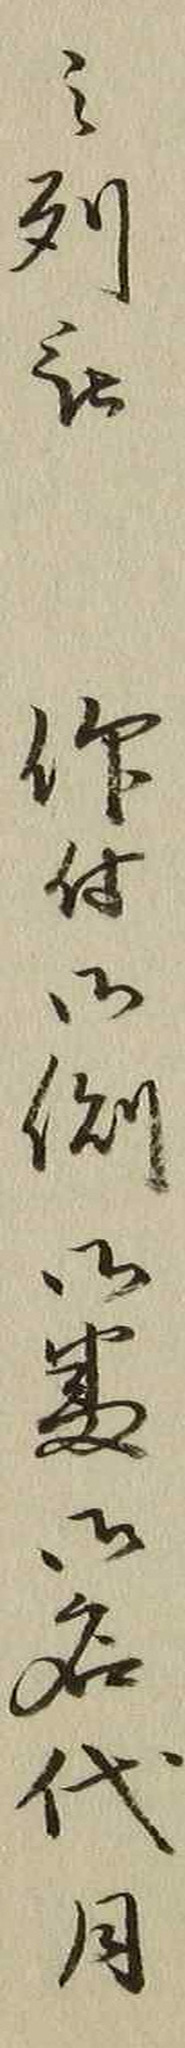之列被仰付御側御番御名代月
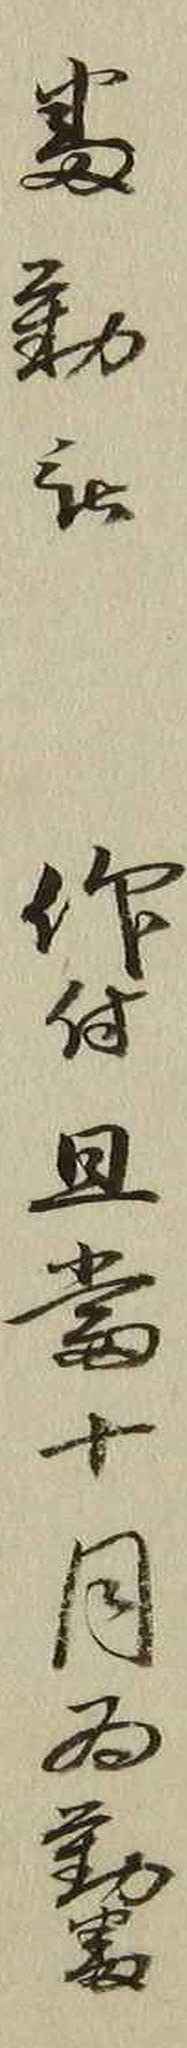番勤被仰付旦当十月為勤番
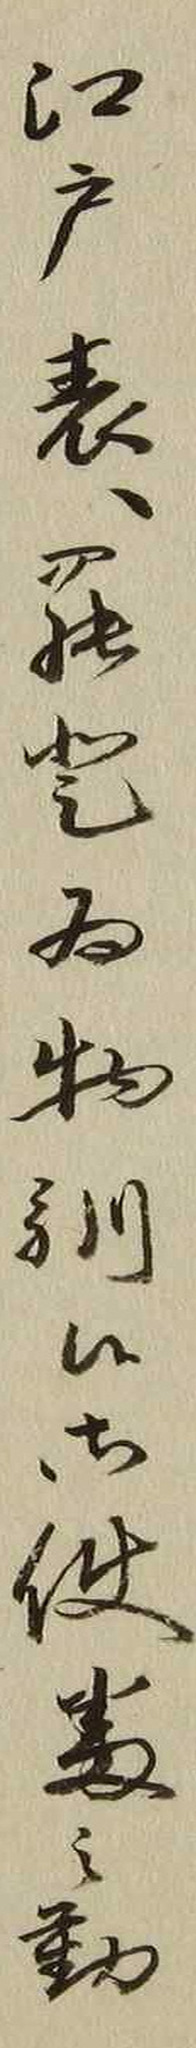江戸表へ罷登為物馴候御使番之勤
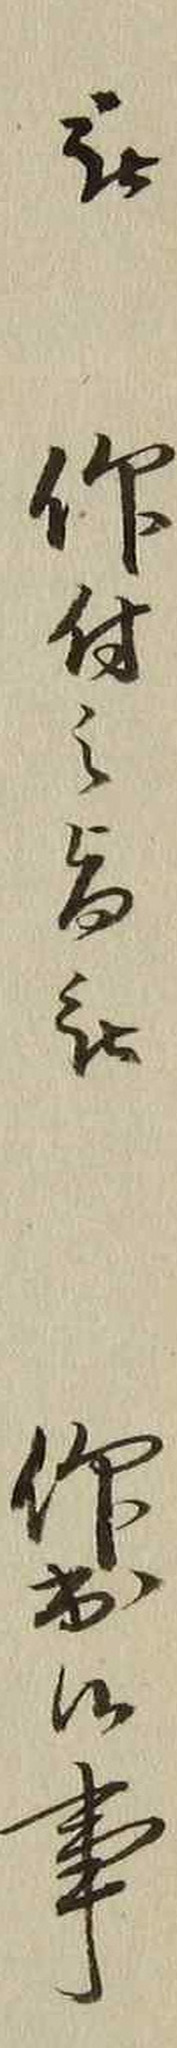被仰付之旨被仰出候事
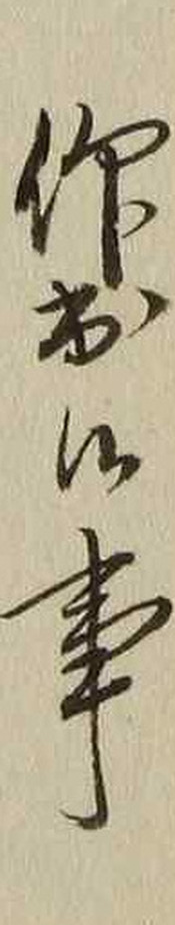仰付候事
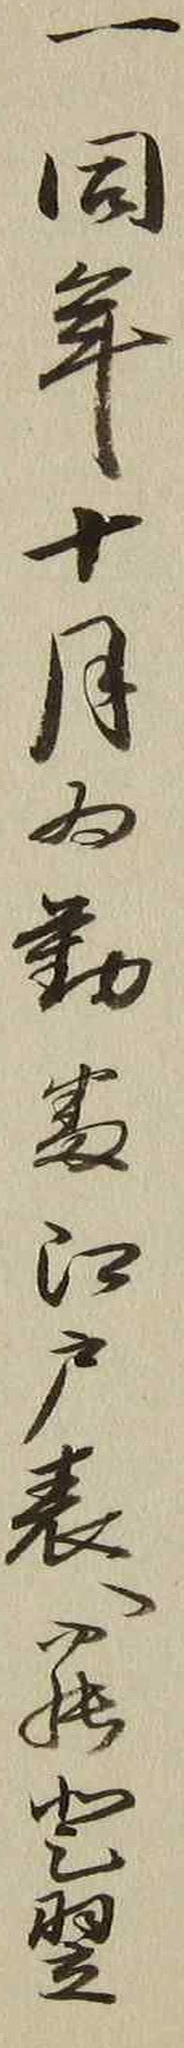一同年十月為勤番江戸表へ罷登翌
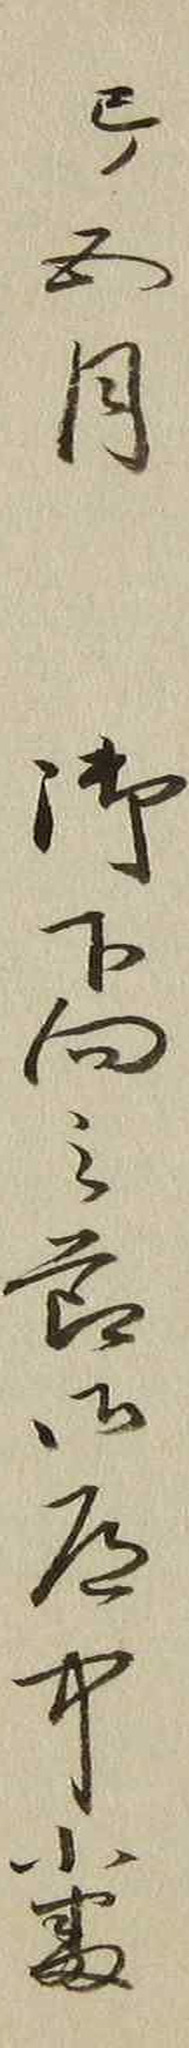巳ノ五月御下向之節御道中小番
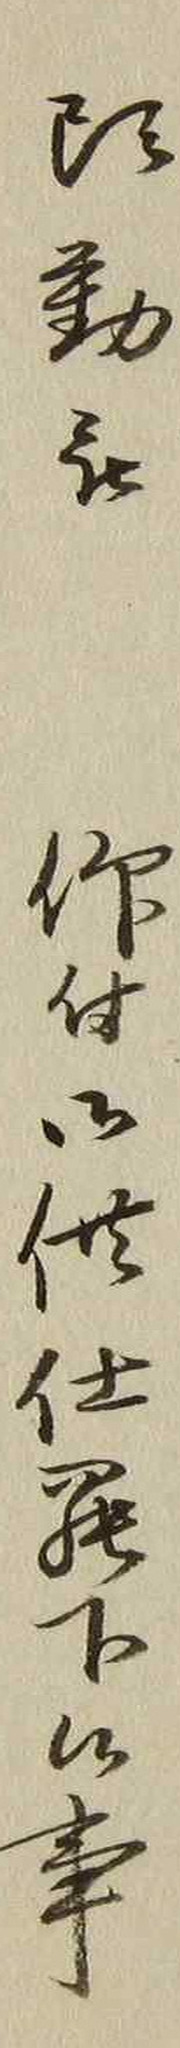頭勤被仰付御供仕罷下候事
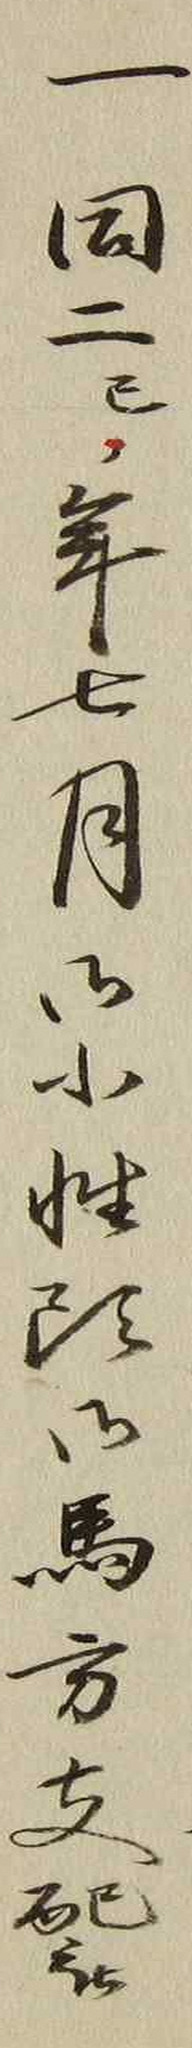一同二巳ノ年七月御小性頭御馬方支配被
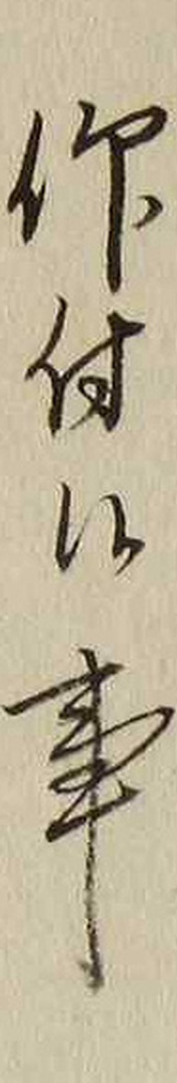仰付候事
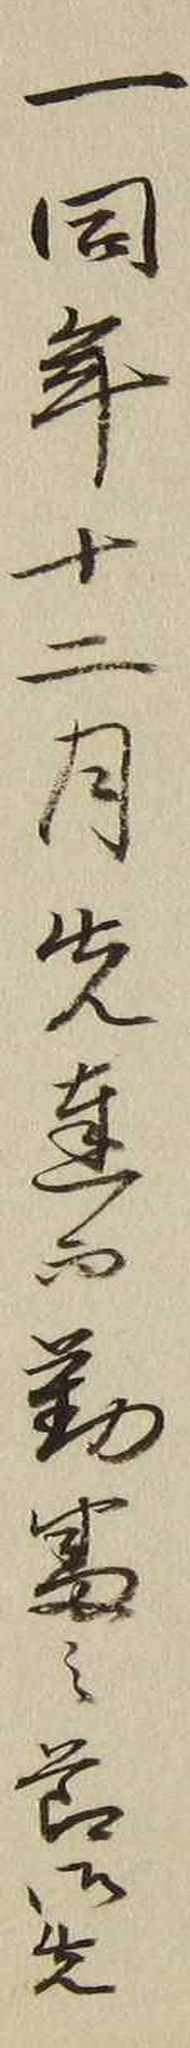一同年十二月先達而勤番之節御先
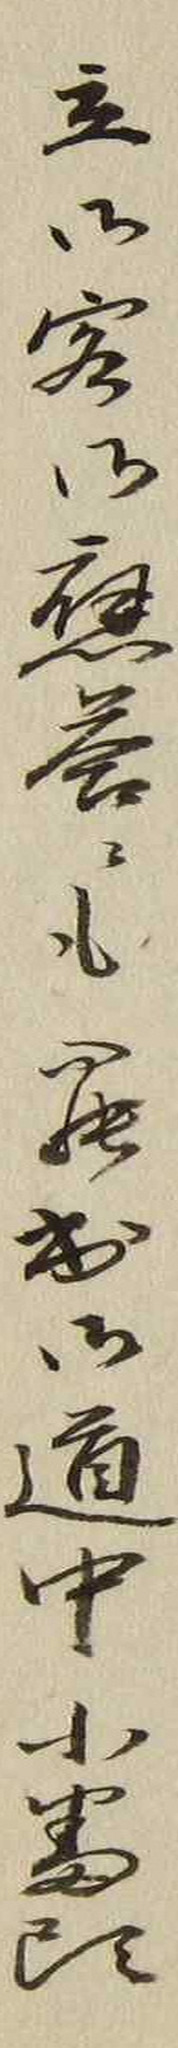立御客御応答にも罷出御道中小番頭
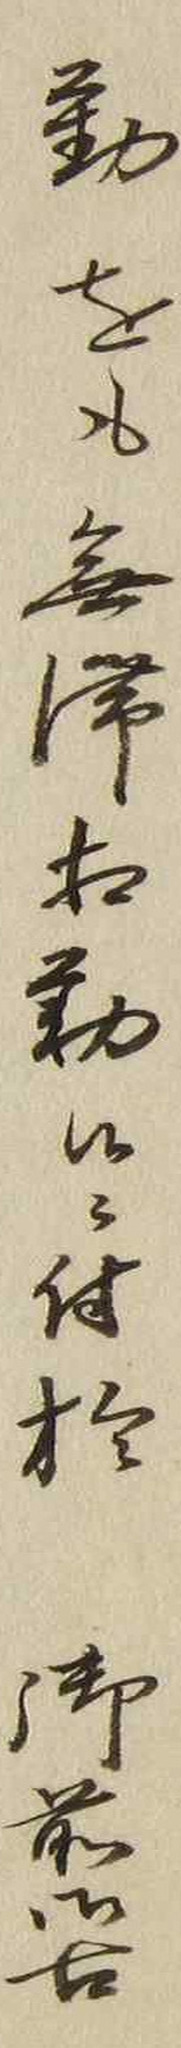勤をも無滞相勤候に付於御前御古
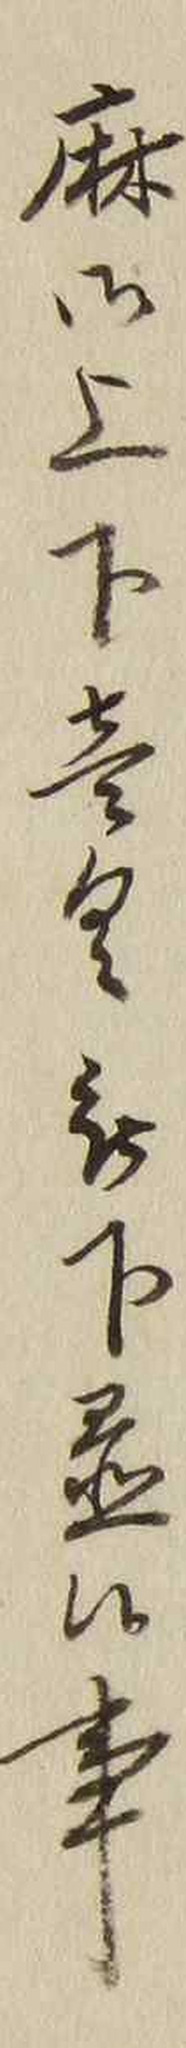麻御上下壱具被下置候事
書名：諸士系譜　巻之133　た之部9
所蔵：会津若松市立会津図書館
